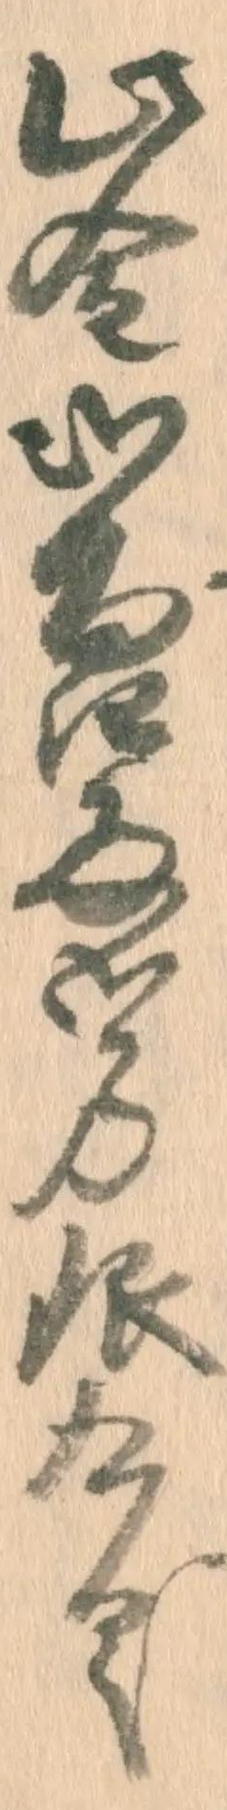此金弐百四両弐分銀九匁
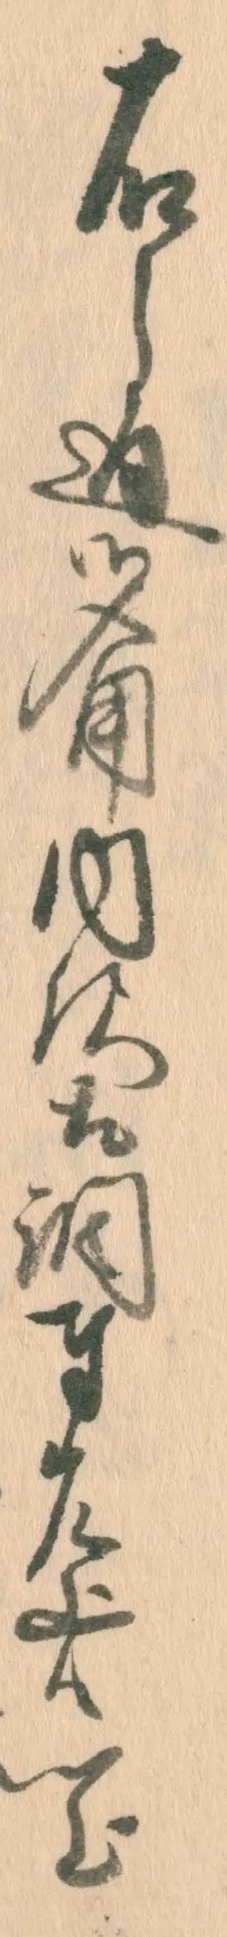右之通御入用内訳取調奉差上候以上
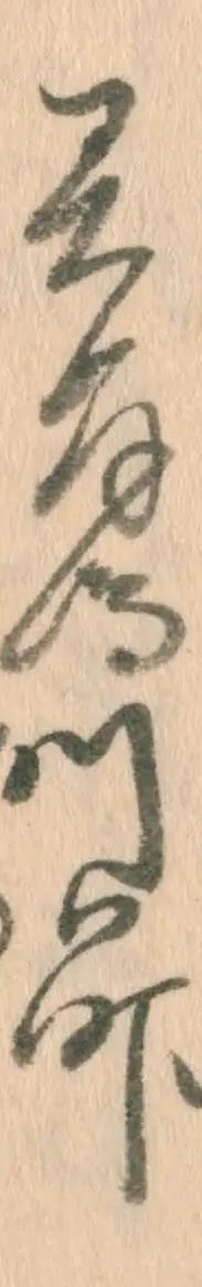霊岸嶋川口町
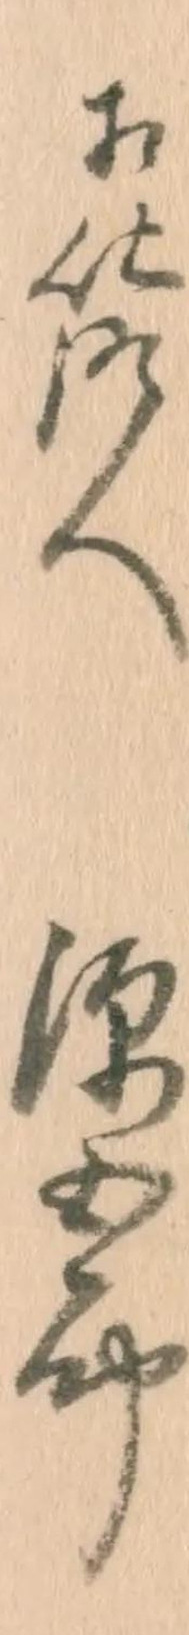相仕証人源五郎
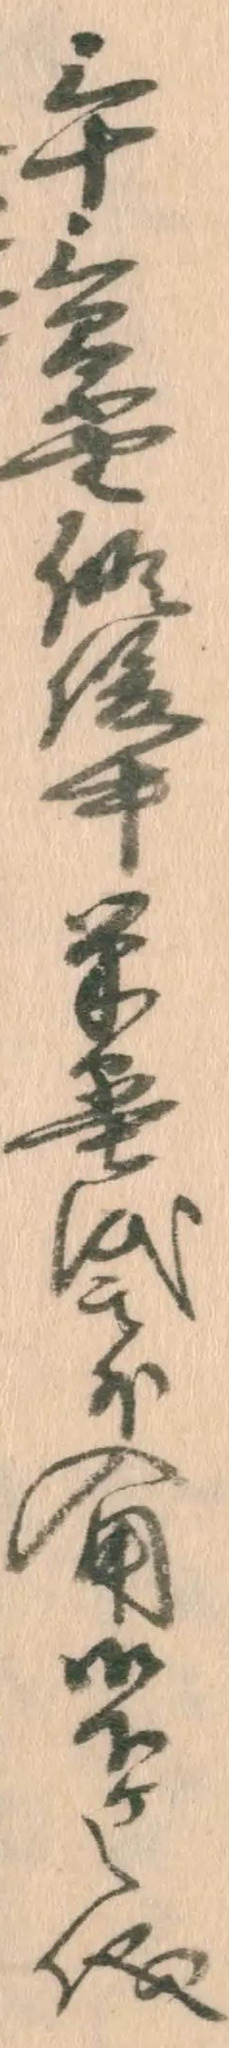│三十三間堂修復中筆墨紙其外入用御下ヶ之儀
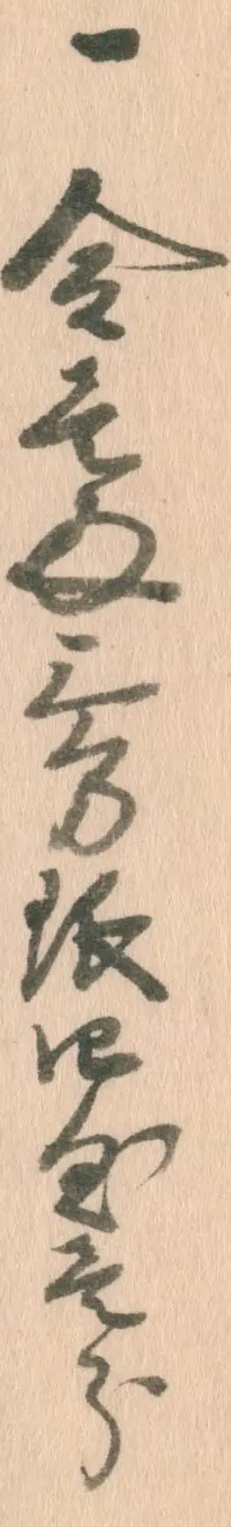一金壱両三分銀四匁壱分
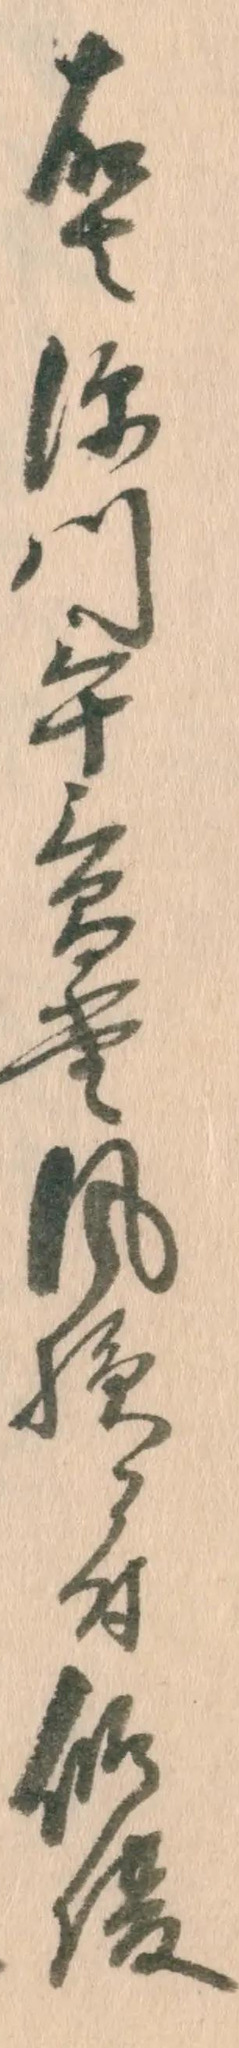右は深川三十三間堂風損に付修復
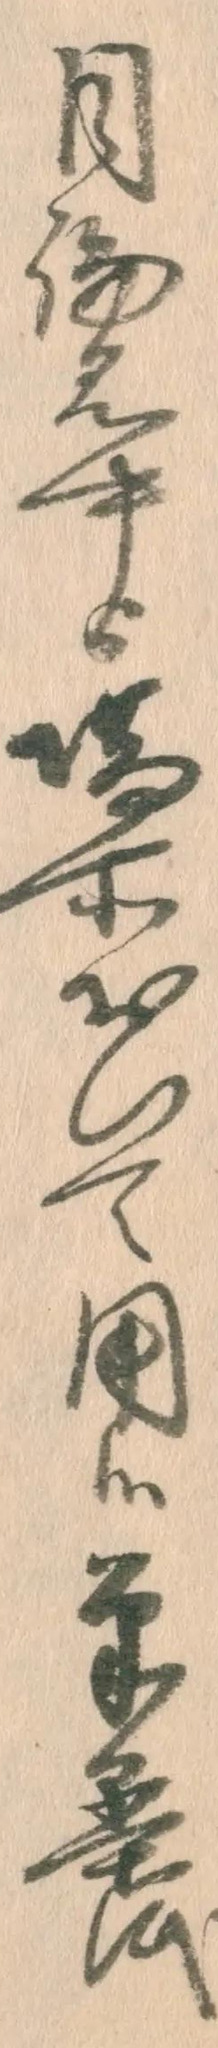目論見中ゟ場所おひて用候筆墨紙

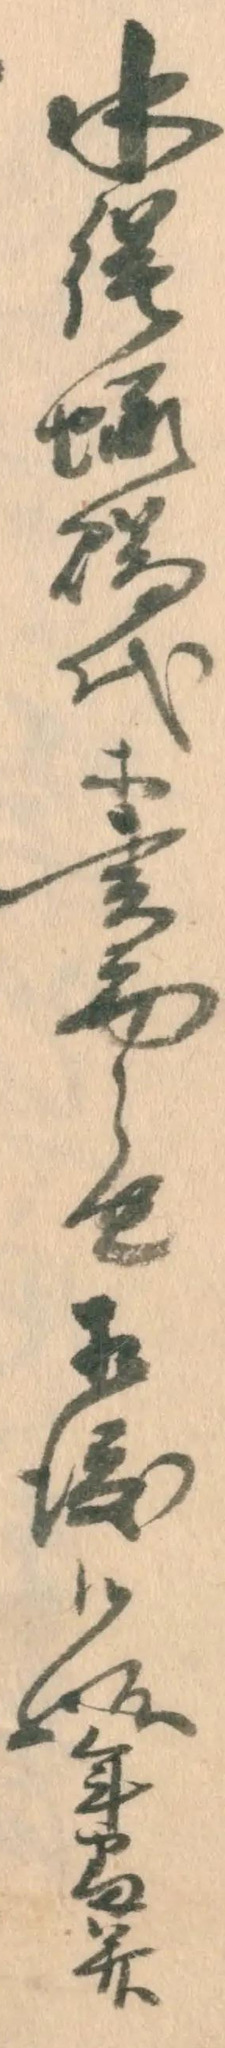水縄蝋燭代等書面之通相渡候様年番幷
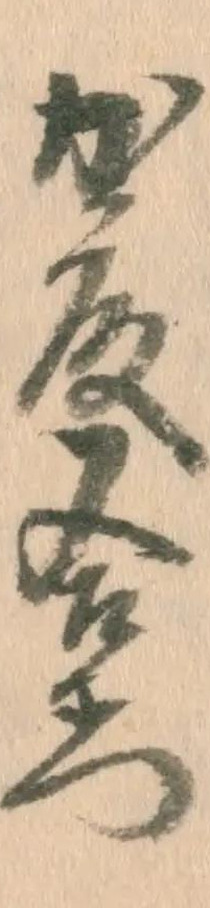卯加藤又左衛門
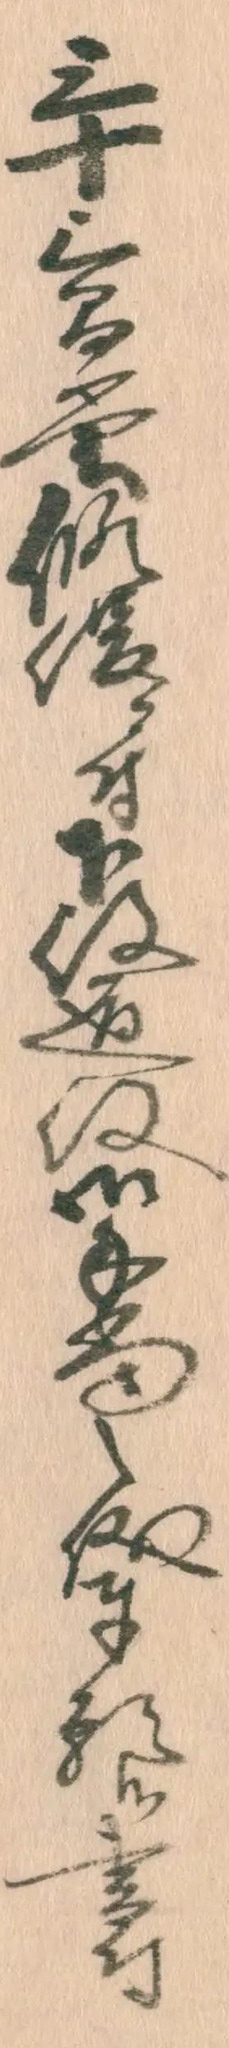│三十三間堂修復に付下役道役御手当之儀奉願候書付
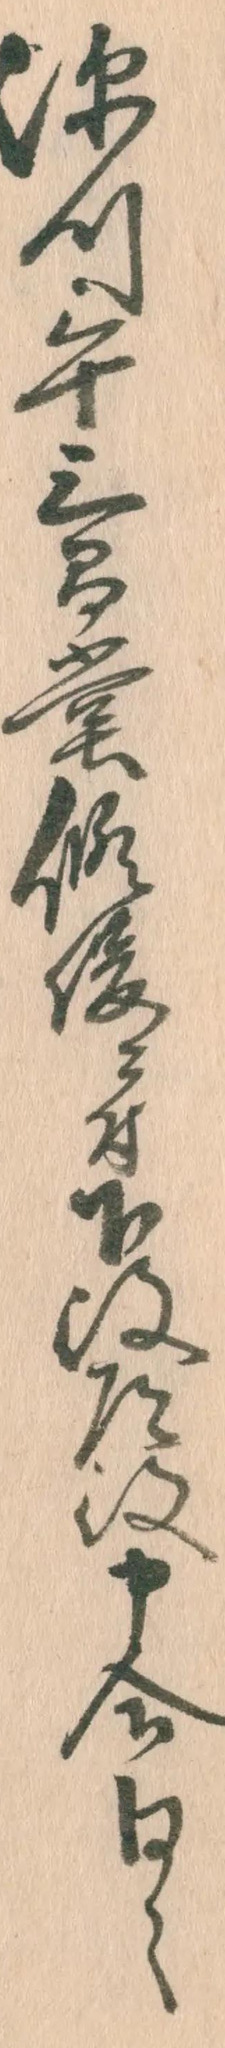深川三十三間堂修復に付下役道役申合日々
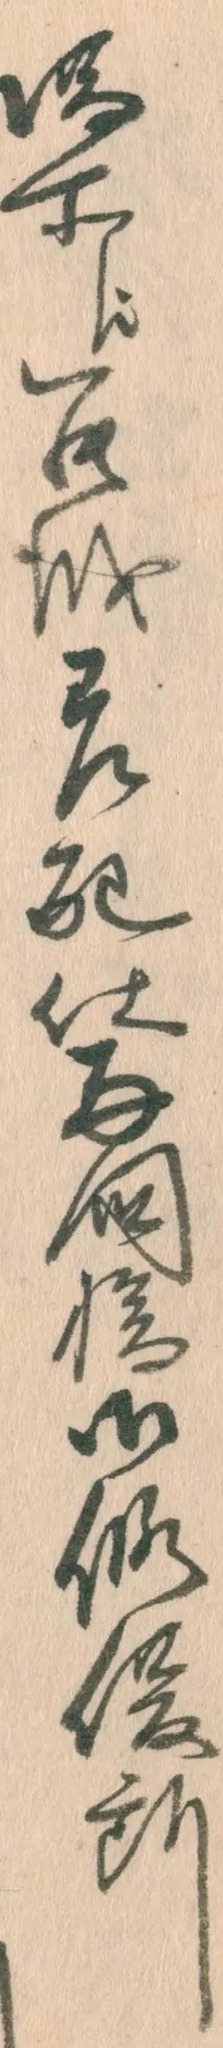場所え罷越差配仕両国橋御修復所
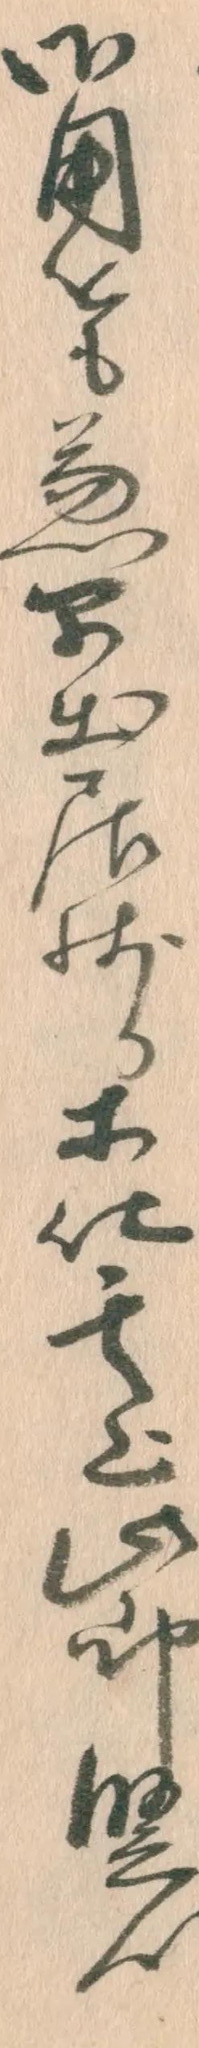御用をも兼早出居残り等仕其上此節堅川

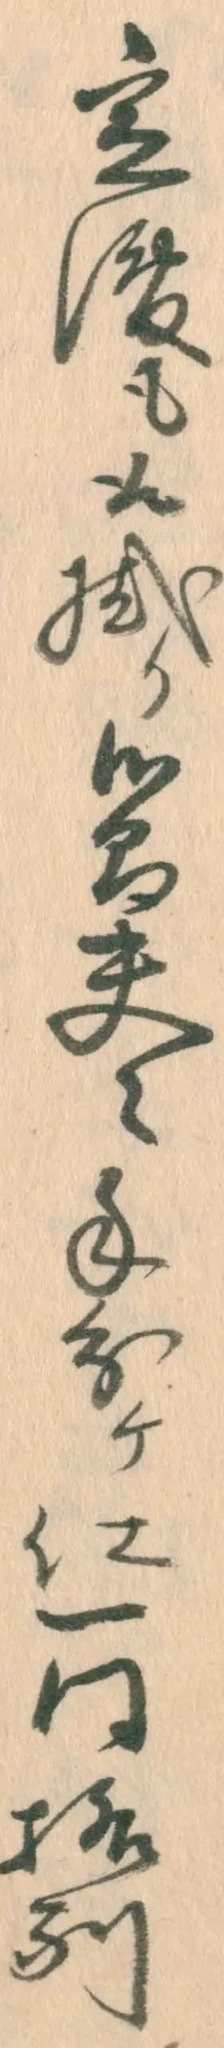定浚も取掛り候間夫々手分ヶ仕一同格別
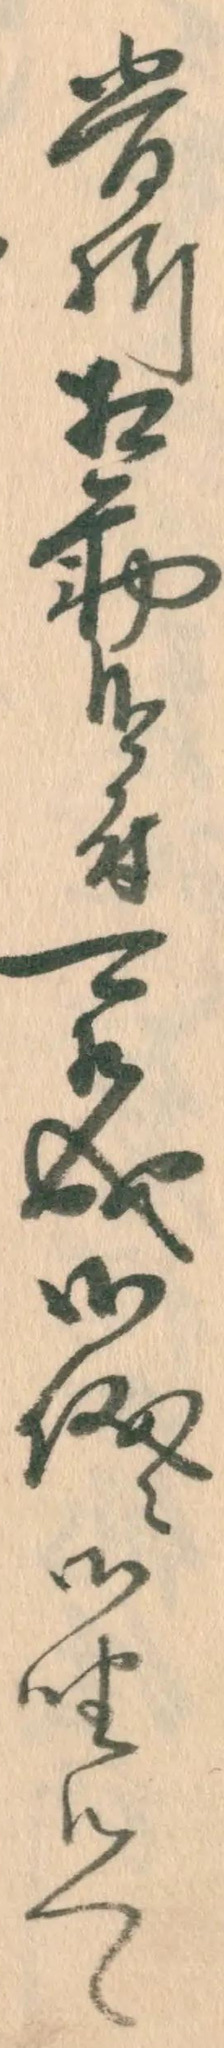骨折相勤候に付可相成候儀に御座候ハヽ
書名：三十三間堂. [1]
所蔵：国立国会図書館 National Diet Library, JAPAN
